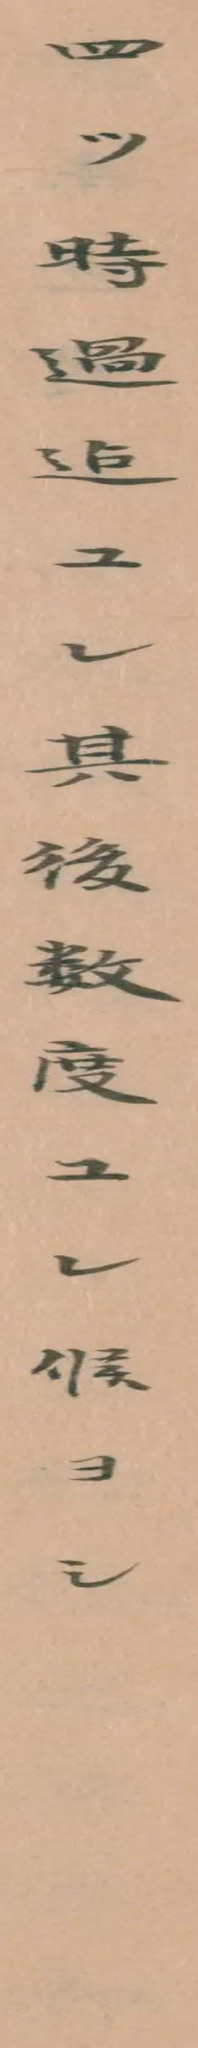四ツ時過迄ユレ其後数度ゆユレ候ヨシ
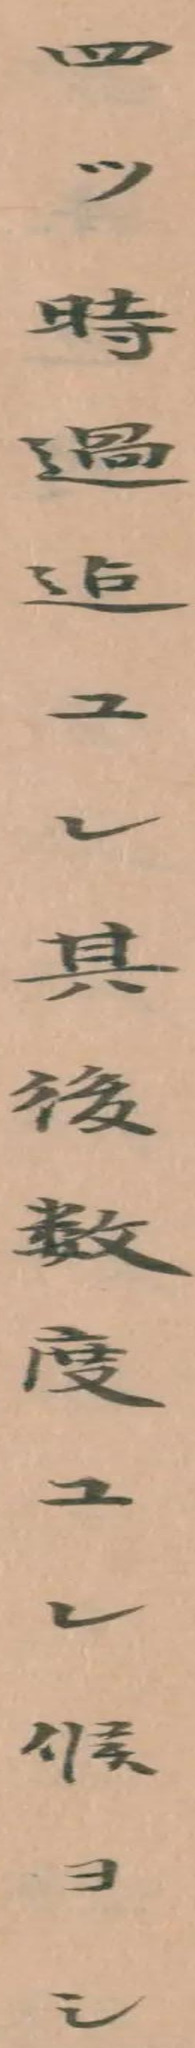四ツ時過迄ユレ其後数度ゆユレ候ヨシ
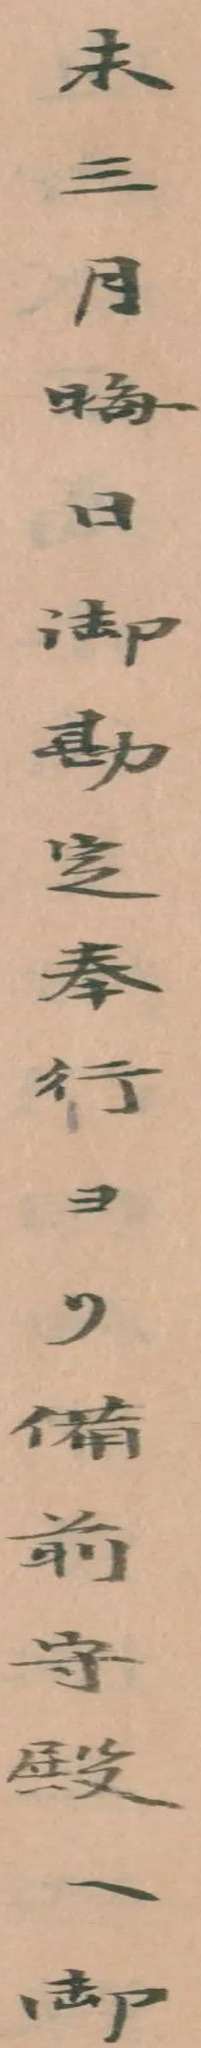未三月晦日御勘定奉行ヨリ備前守殿へ御
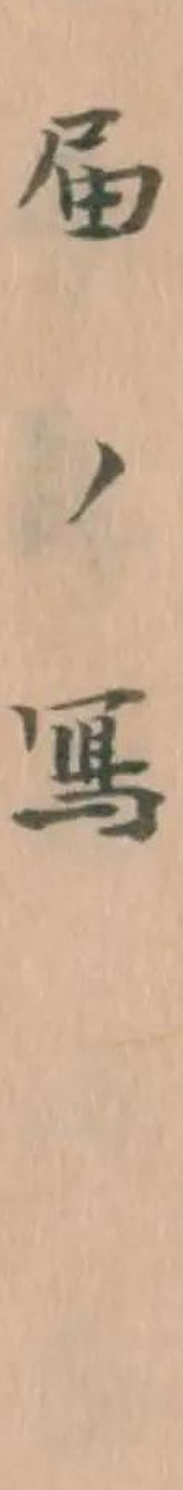届ノ写
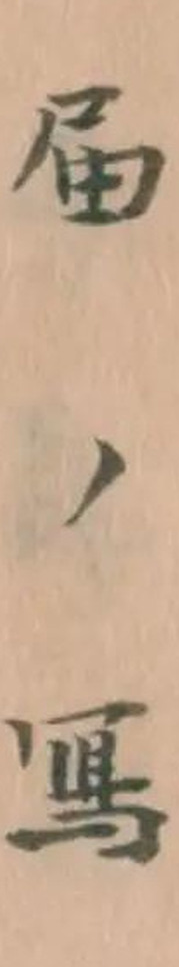届ノ写
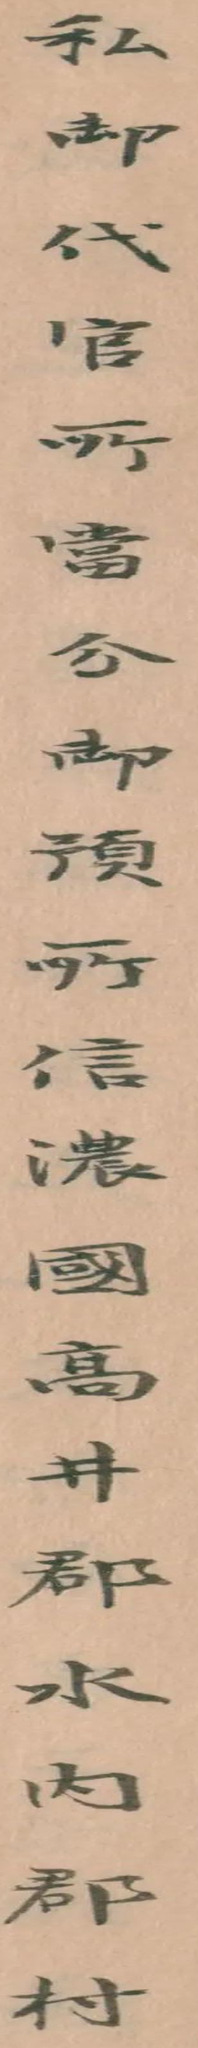私御代官所当分御預所信濃国高井郡水内郡村
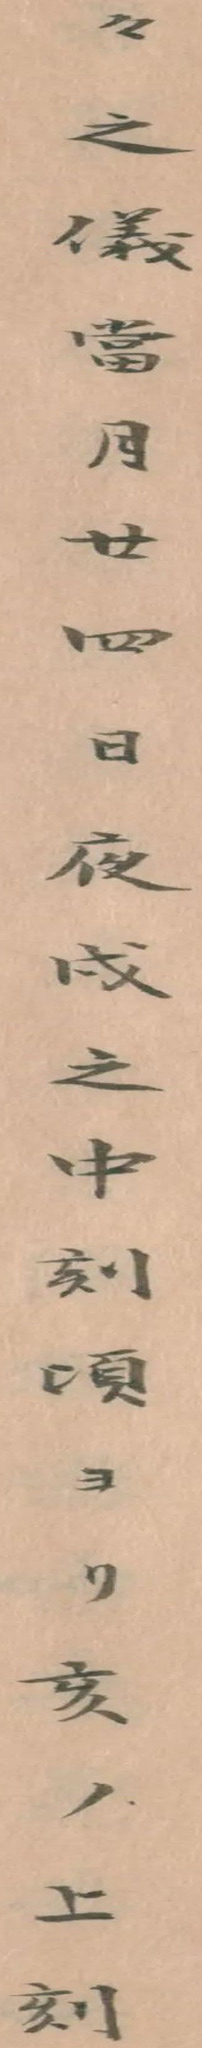々之儀当月廿四日夜戌之中刻頃ヨリ亥ノ上刻
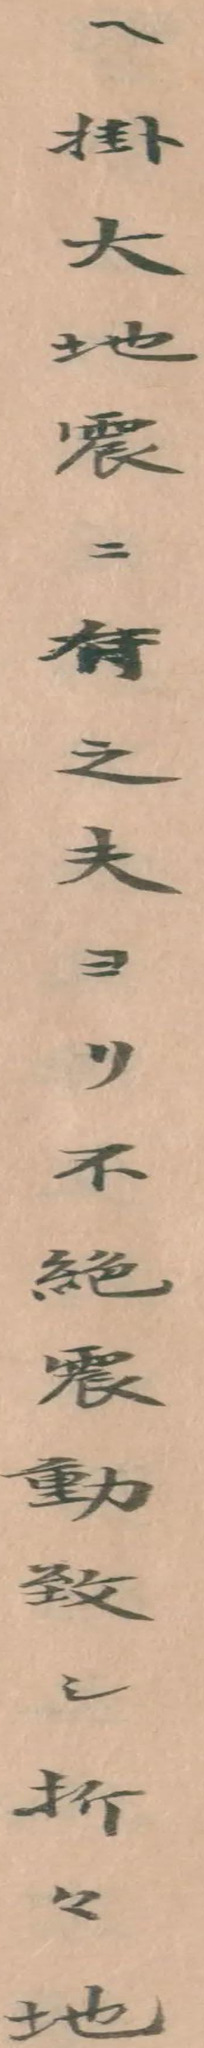へ掛大地震二有之夫ヨリ不絶震動致シ折々地
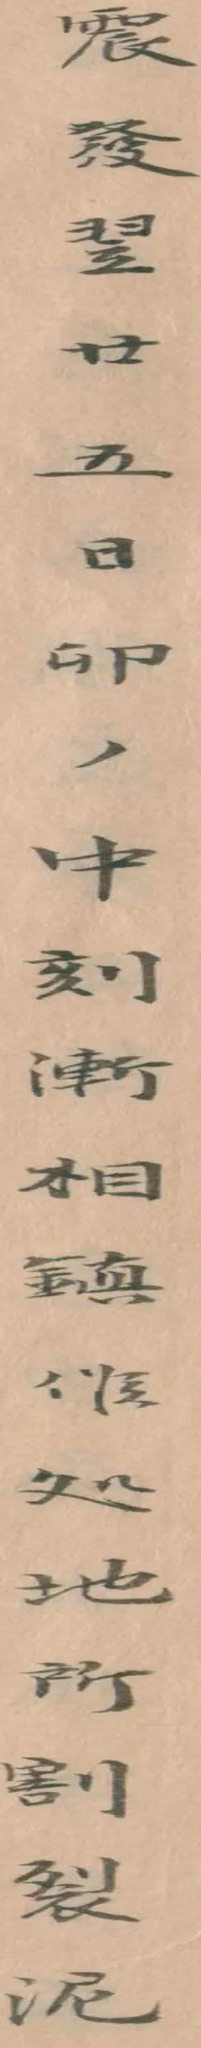震発翌廿五日卯ノ中刻漸相鎮候処地所裂割泥
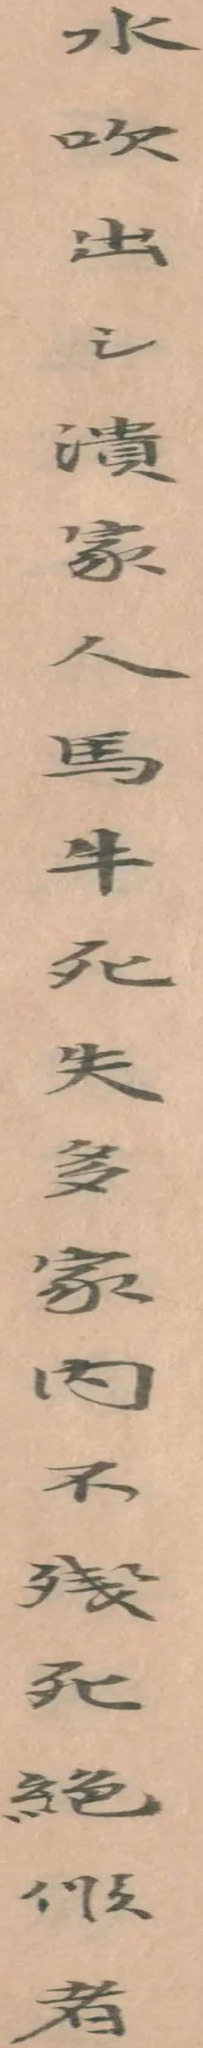水吹出シ潰家人馬牛死失多家内不残死絶候者

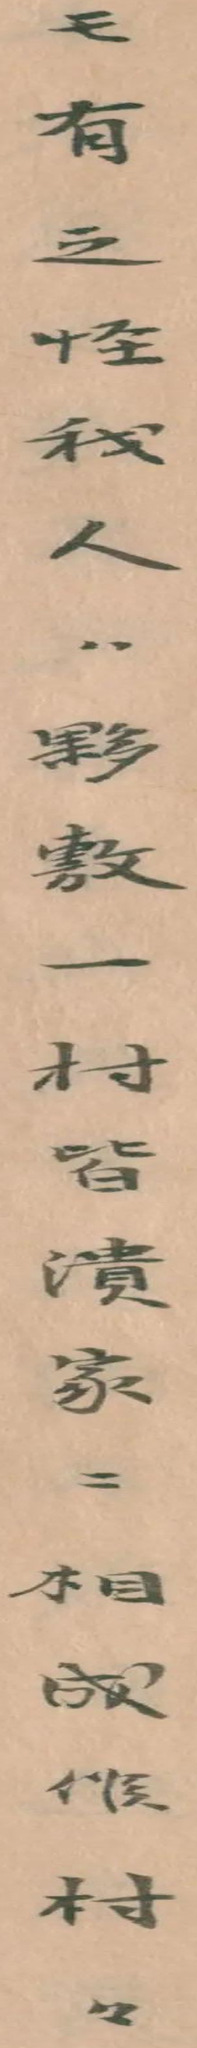モ有之怪我人ハ夥敷一村皆潰家ニ相成候村々
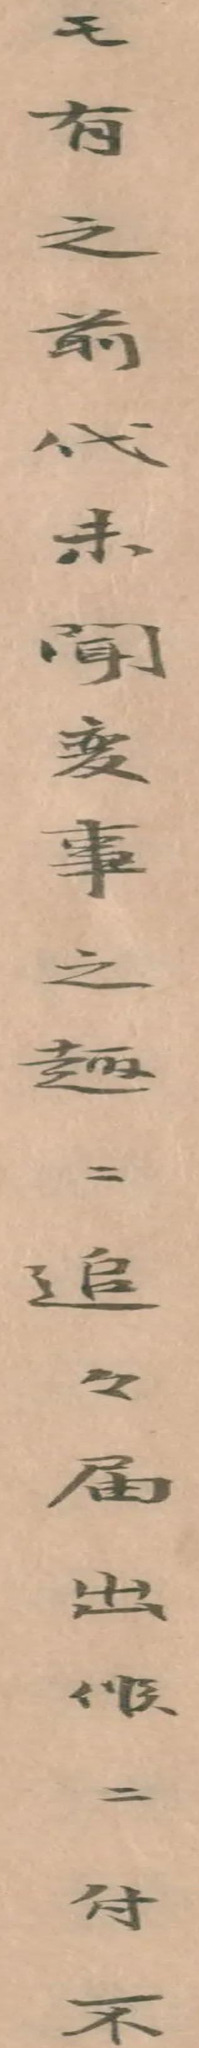モ有之前代未聞変事之趣二追々届出候ニ付不
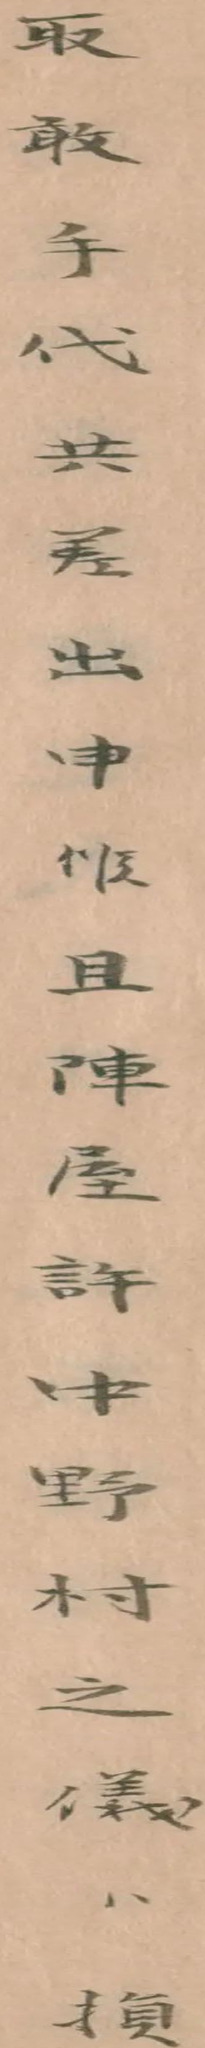取敢手代共差出申候且陣屋許中野村之儀ハ損
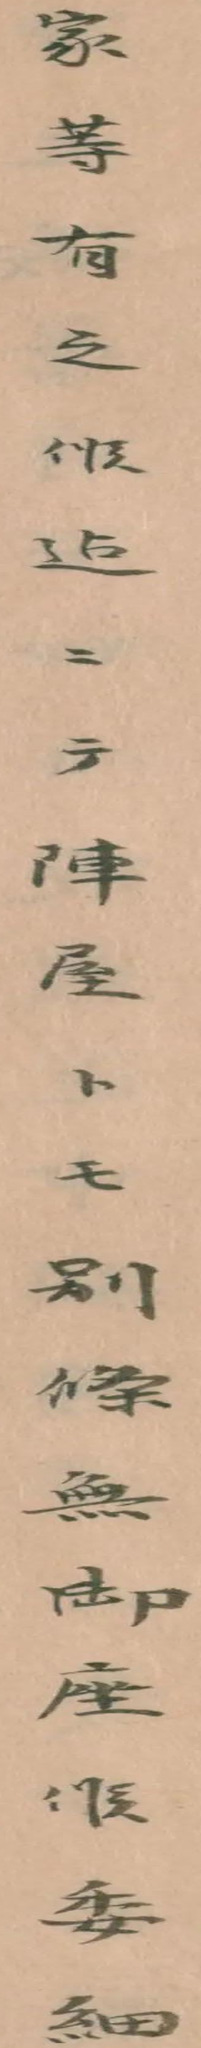家等有之候迄ニテ陣屋トモ別条無御座候委細
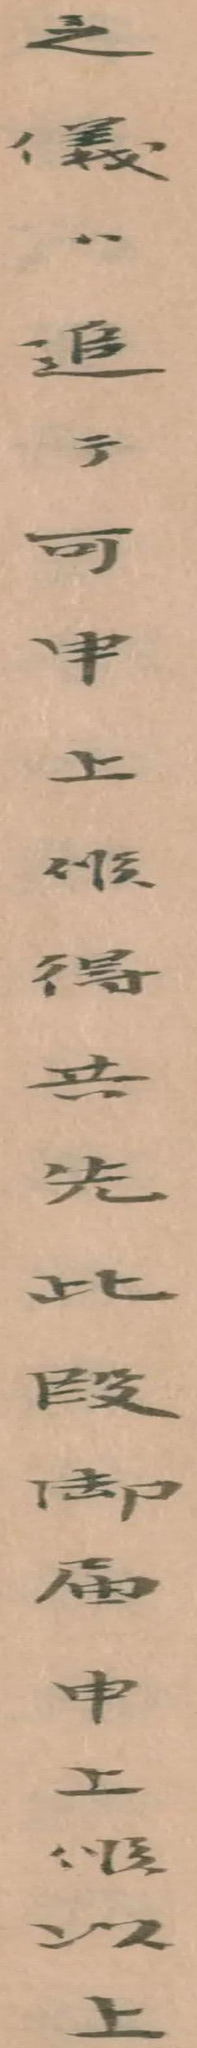之儀ハ追テ可申上候得共先此段御届申上候以上
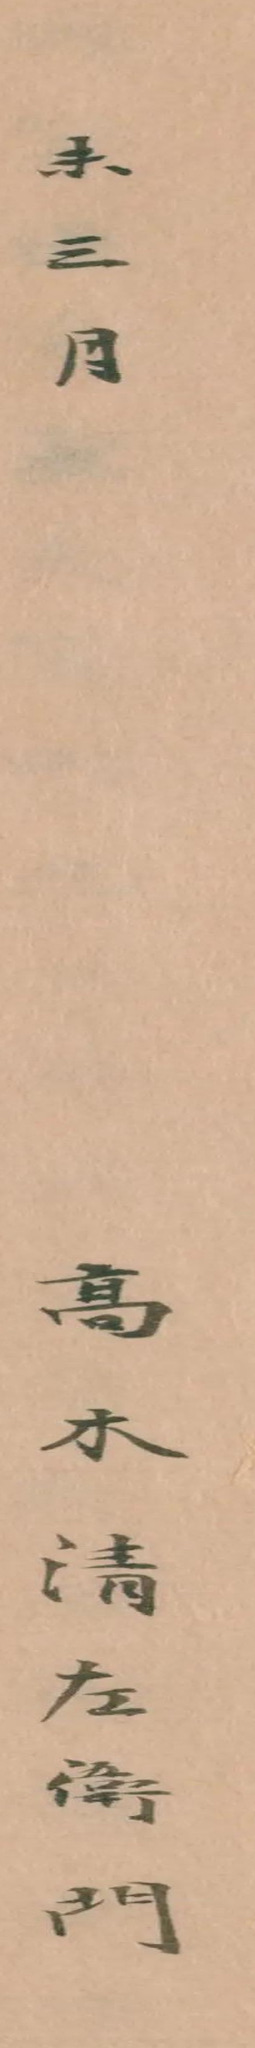未三月高木清左衛門
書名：地災撮要. 巻1(噴火山・地震ノ部)
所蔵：国立国会図書館 National Diet Library, JAPAN
